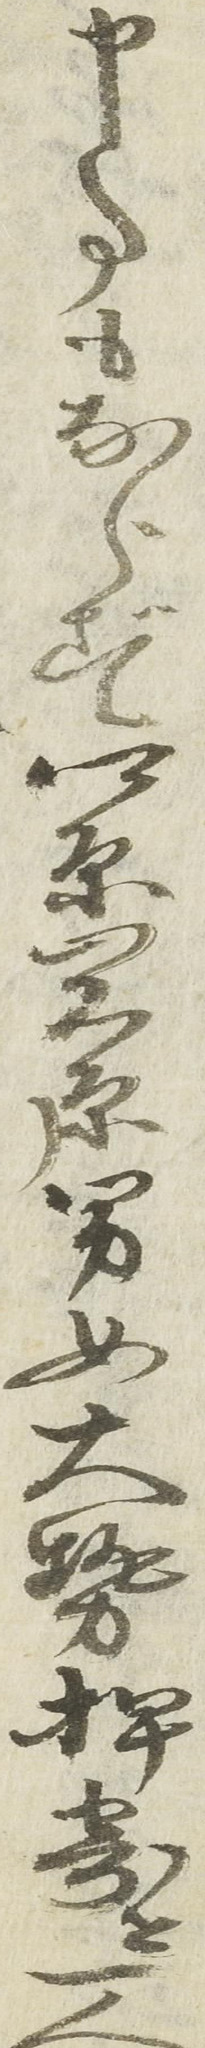申事もならず郷原岩原男女大勢押寄せ一人
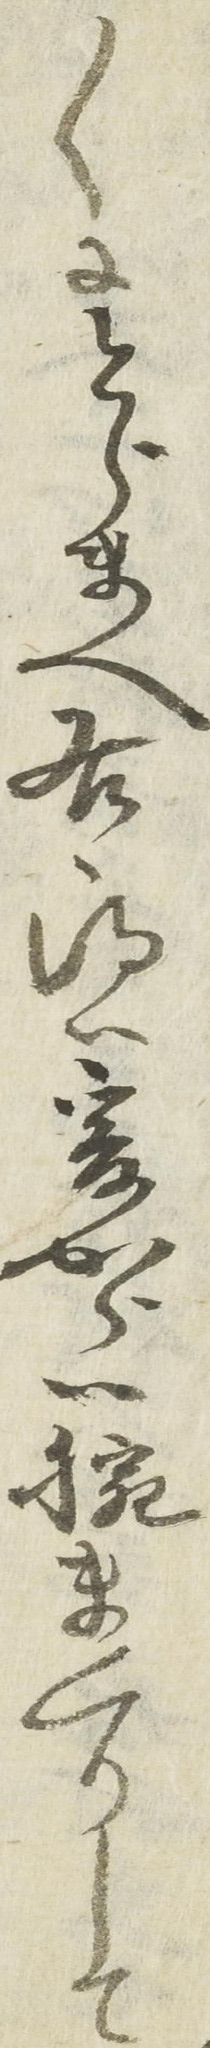〳〵にとらまへ居候得は爰からは腕まくりして
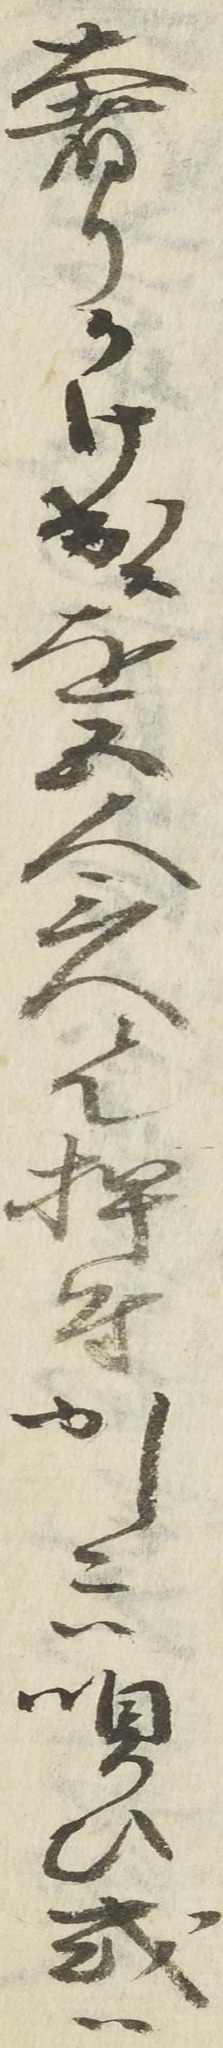奢りかけ出スを五人三人ニて押付かしこは唄ひ或は
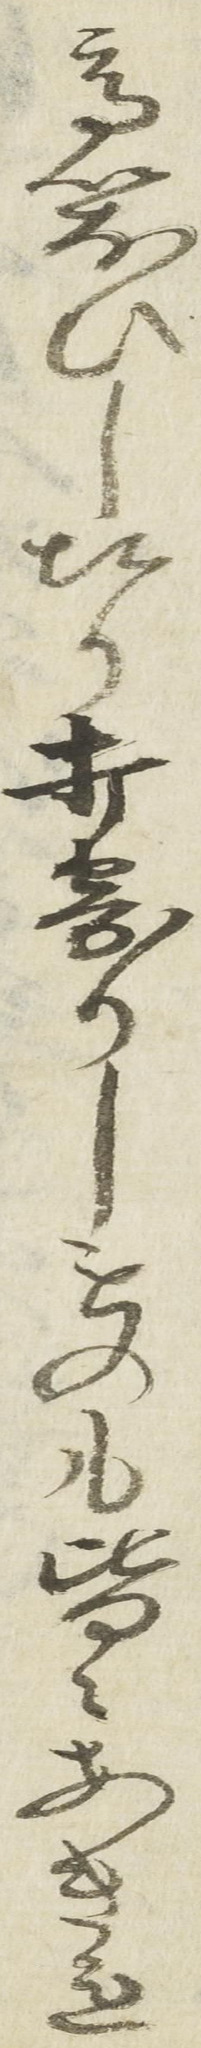高笑ひしたり打寄りしものも皆〻あきれ
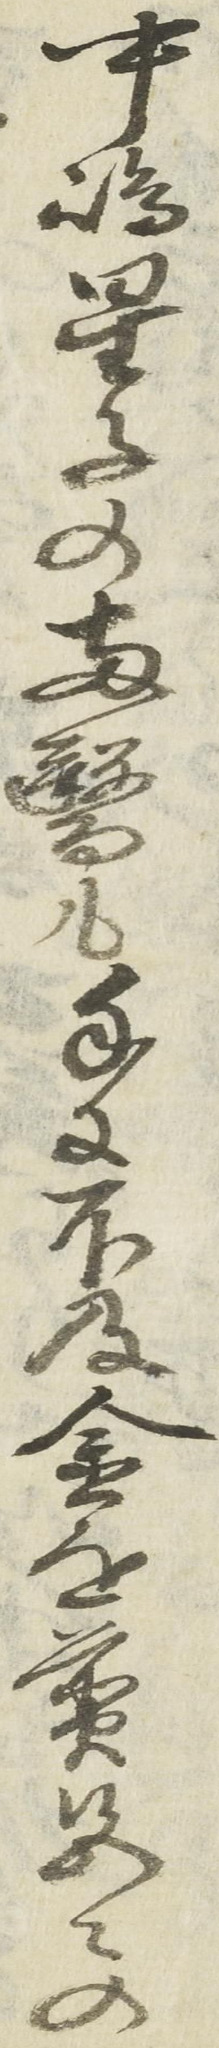中嶋星子の両医も手に不及金を費色〻の
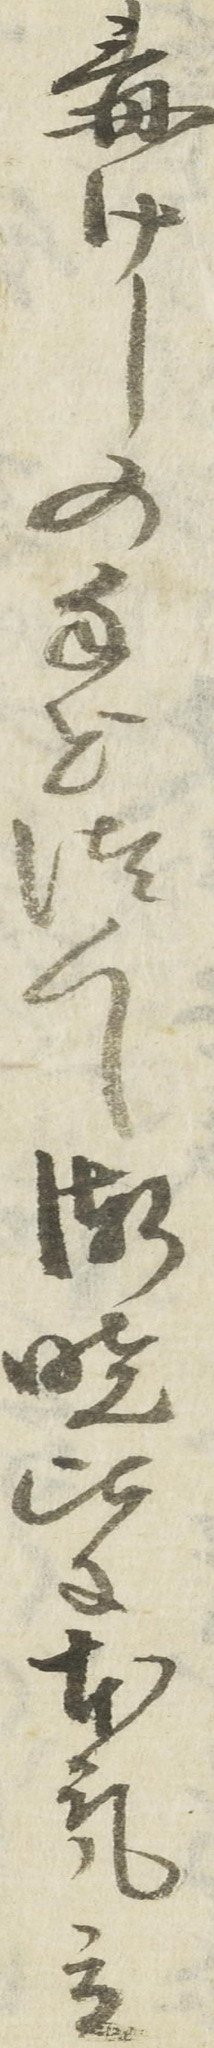毒けしの手をつくし漸晩比に本気立
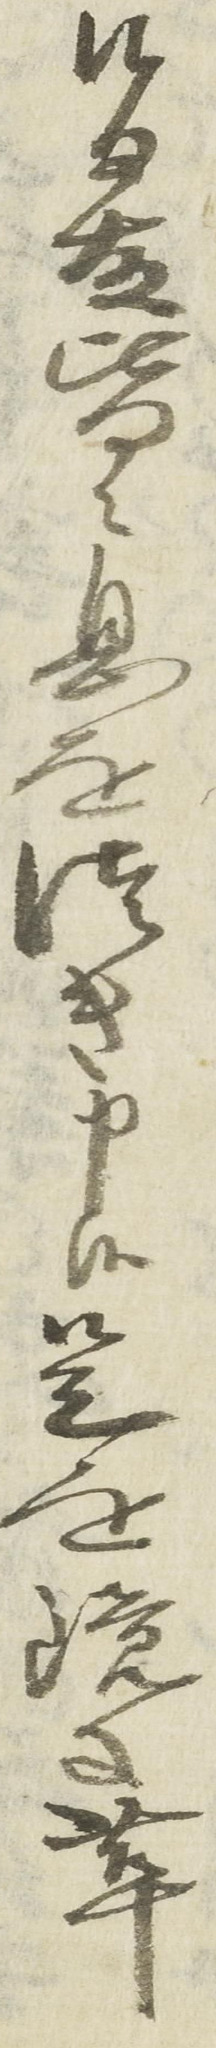ける故皆〻息をつき申候是を境に草
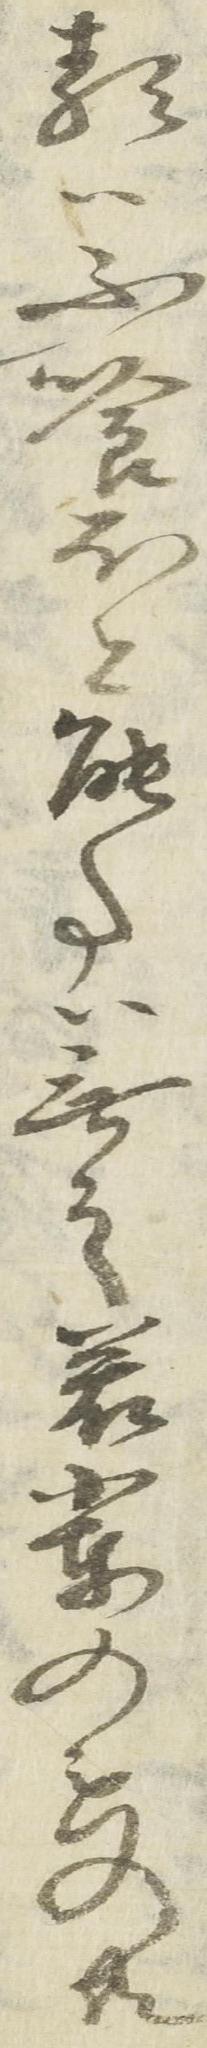類は不喰なと能事は無之若輩のもの共
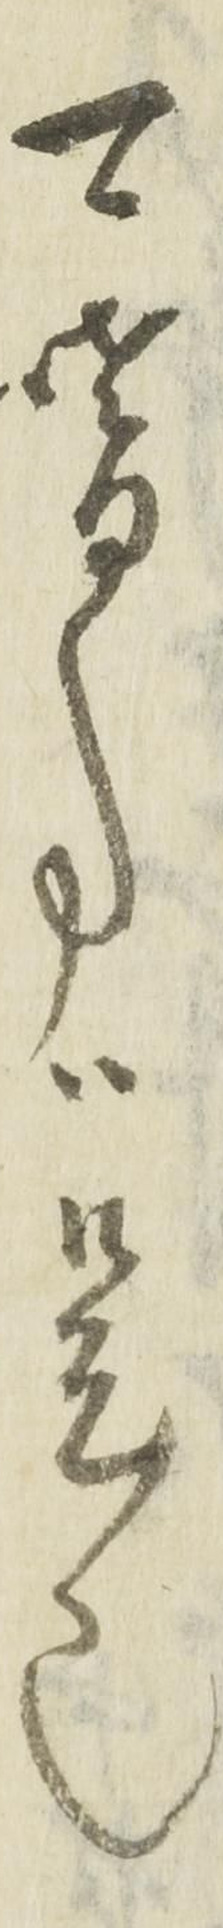可嗜事は是也
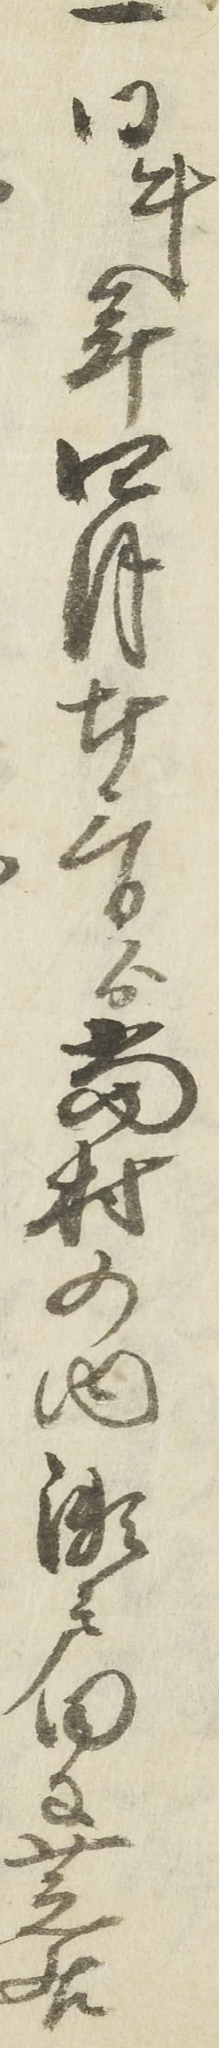一同午年四月廿三日ゟ当村の内瀬戸田に芝居
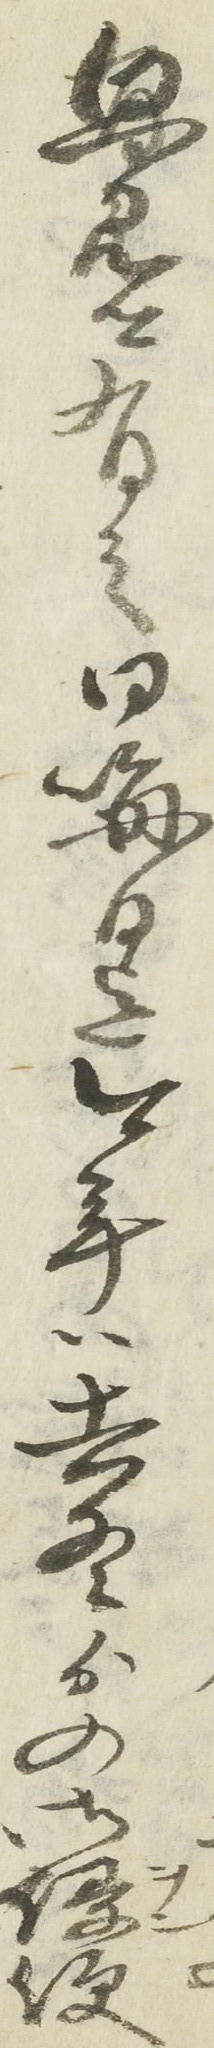㒵見せ有之同晦日迄今年は去冬ゟの御穏便
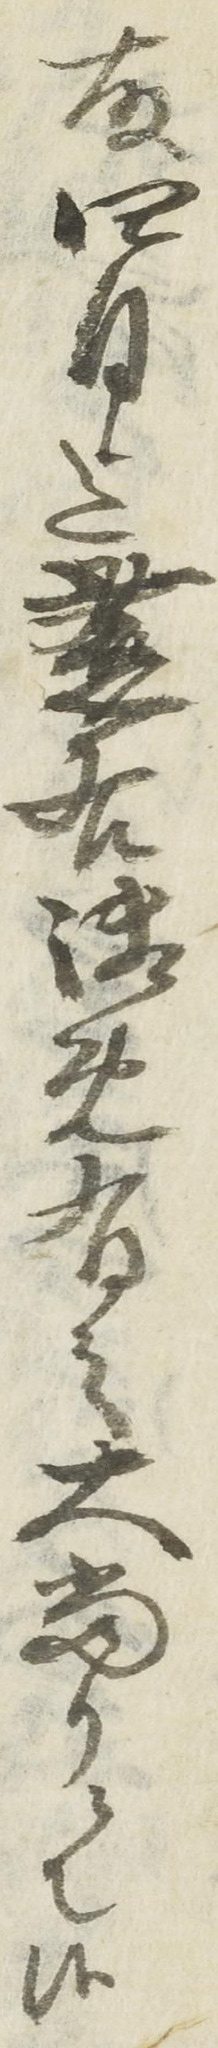故四月迄芝居御免有之大当りニて候
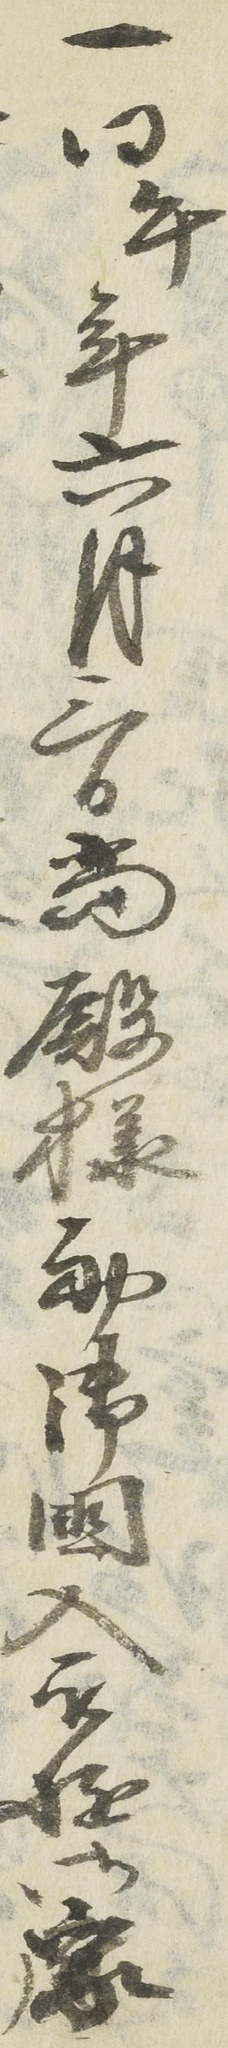一同午年六月三日当殿様初御国入被遊御家
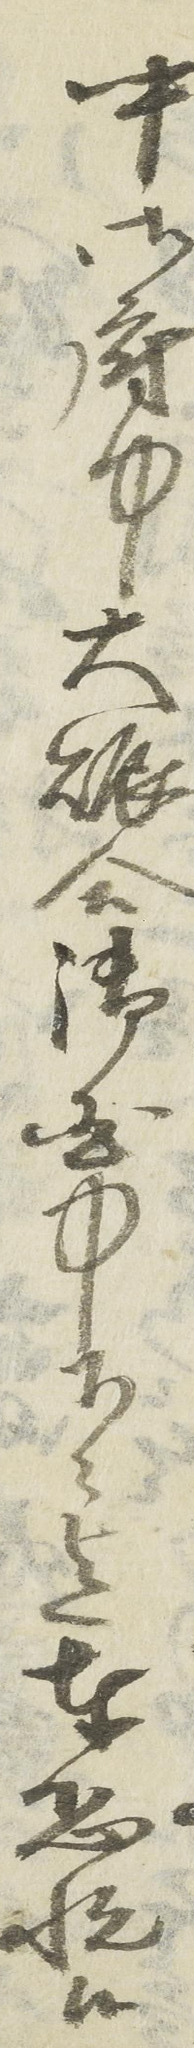中御府中大賑合御国中下〻迄奉恐悦候
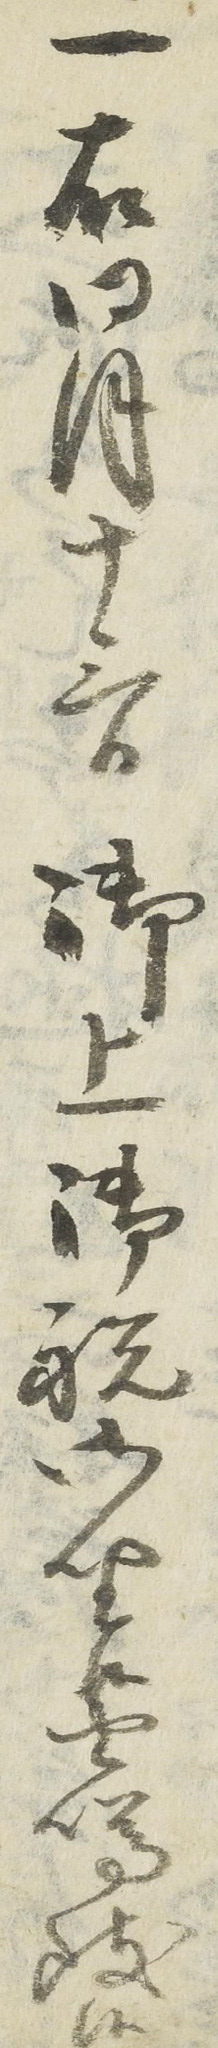一右同月十三日御上御祝御坐候由噂致候
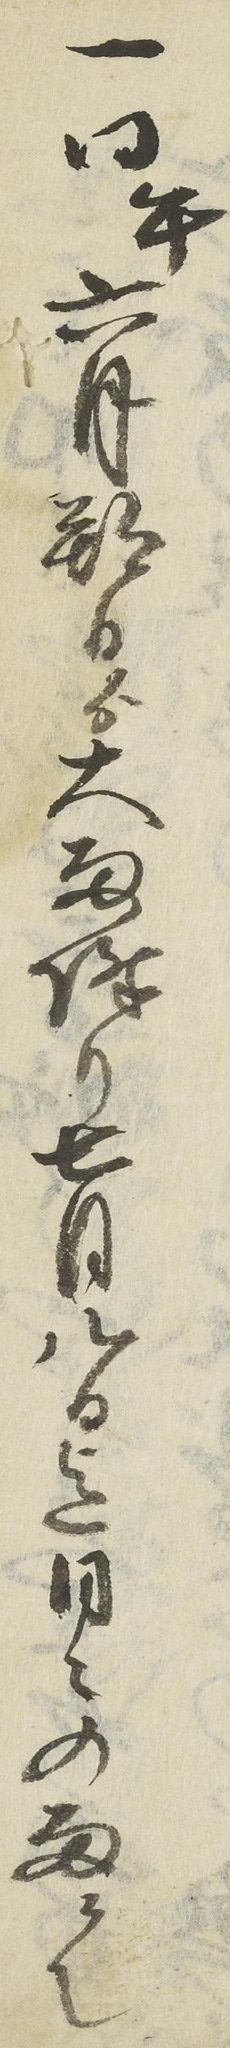一同午六月朔日ゟ大雨降り七月八日迄日〻の雨ニて
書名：後見笑
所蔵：東京大学地震研究所図書室 Earthquake Research Institute Library, The University of Tokyo, JAPAN
